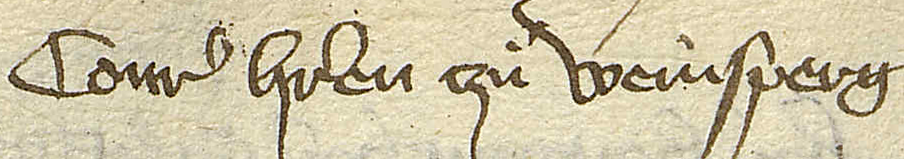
Conr* hr*en cʒü Weinſperg
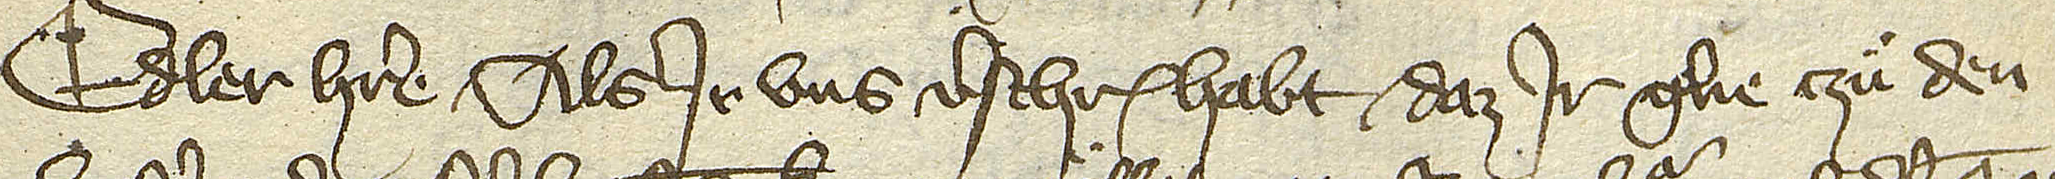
Edler hr*e / Als Ir vns v*ſchr* habt / daʒ Ir g*ne cʒü den
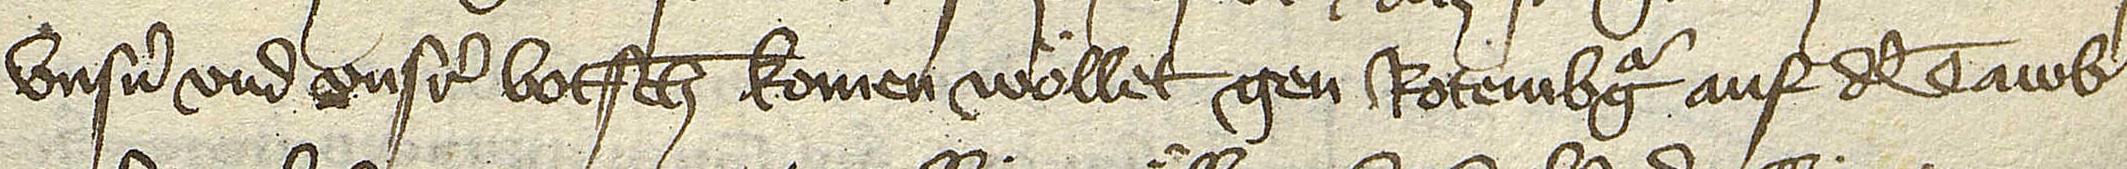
vnſn* vnd vnſr* botſch* komen wöllet gen Rotemb*g auf d* Tawb*
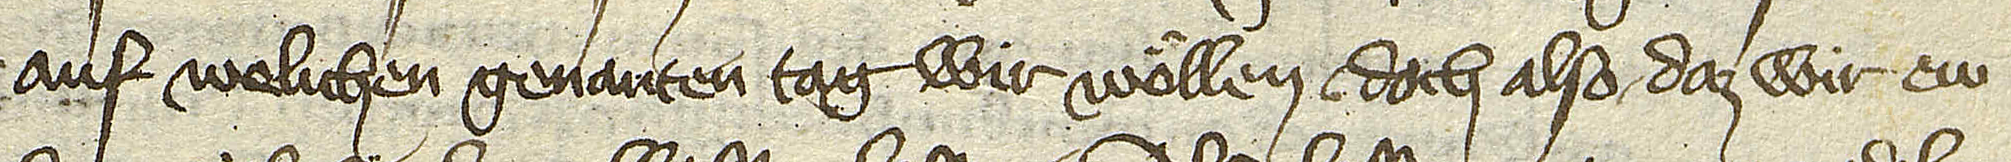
auf welichen genanten tag wir wöllen / doch alſo / daʒ wir ew
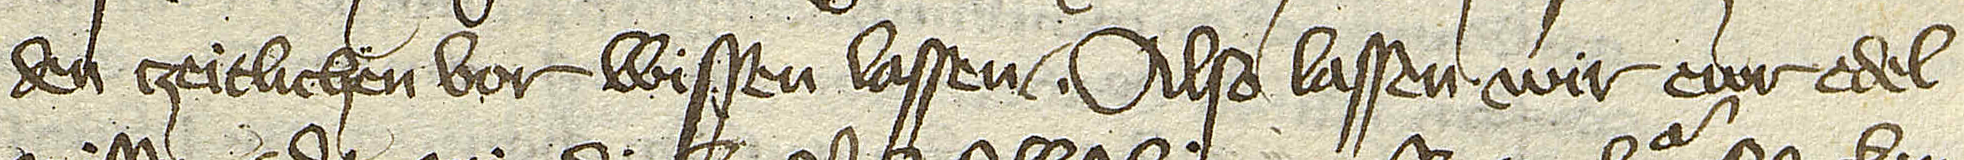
den cʒeitlichen vor wiſſen laſſen / . Alſo laſſen wir ewr edel
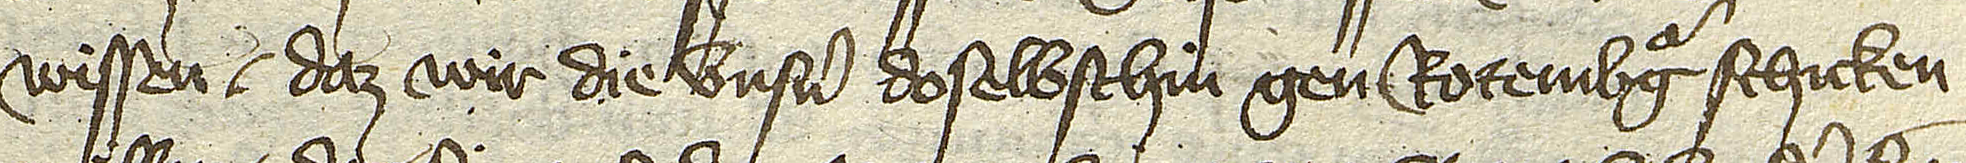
wiſſen / daʒ wir die vnſn* doſelbſthin gen Rotemb*g ſchicken
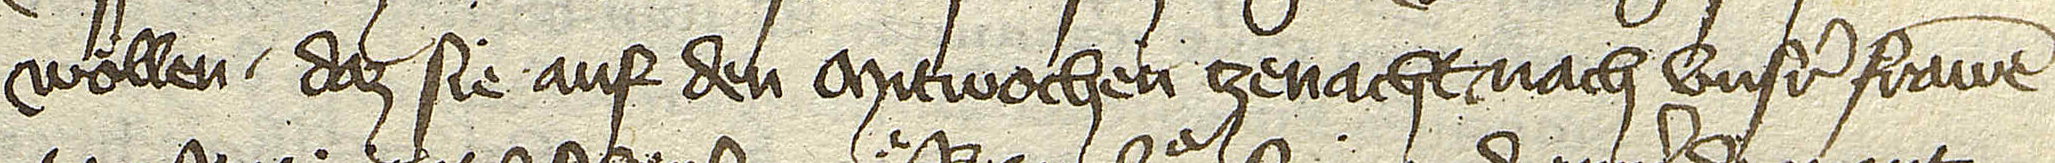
wöllen / daʒ ſie auf den Mitwochen cʒenacht nach vnſr* frawe*
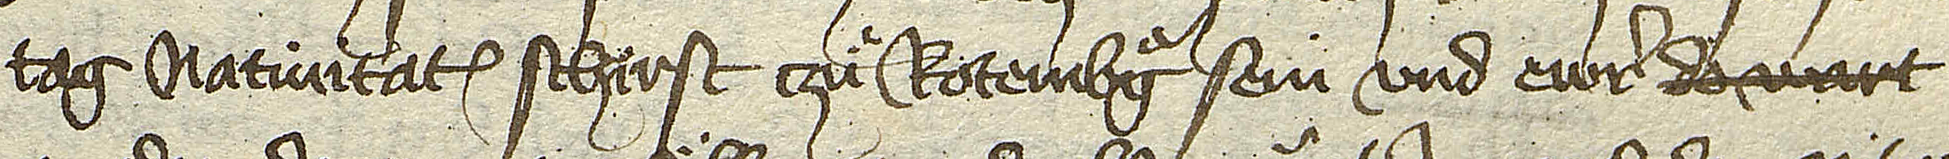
tag Natiuitat* ſchirſt cʒü Rotemb*g ſein vnd ewr* do wart
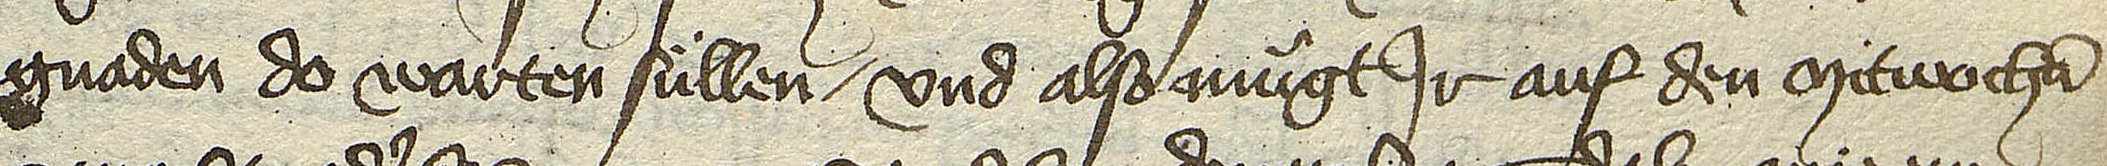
gnaden do warten ſüllen / vnd alſo mügt Ir auf den Mitwochn*
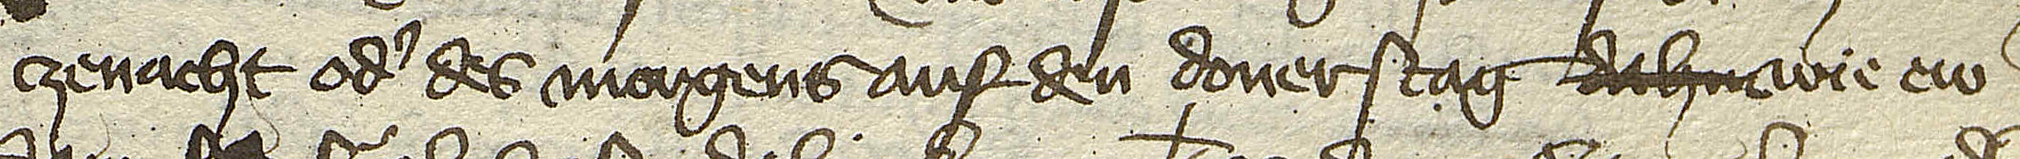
cʒenacht od* des morgens auf den donerſtag dahin wie ew
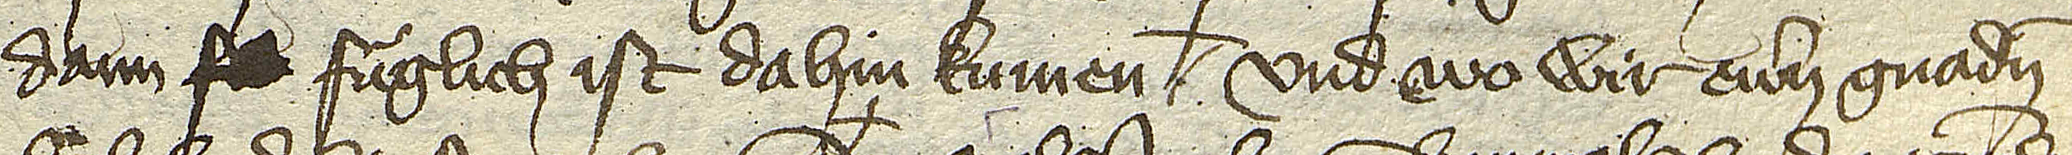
dann f% füglich iſt dahin kumen / vnd wo wir ew*n gnadn*
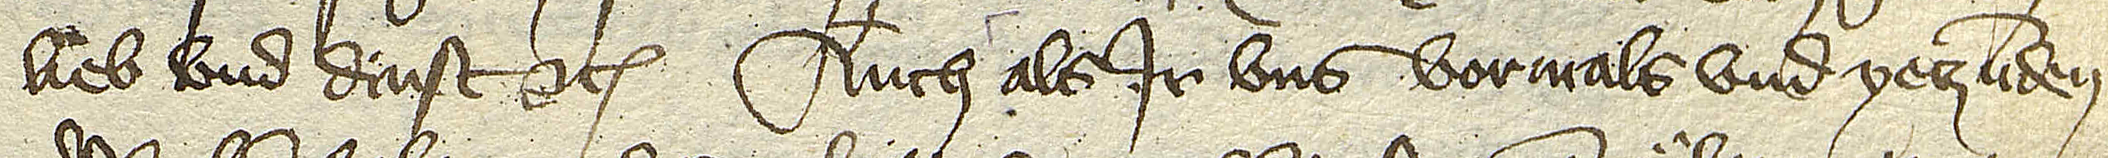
lieb vnd dinſt ec* Auch als Ir vns vormals vnd yecʒu*den
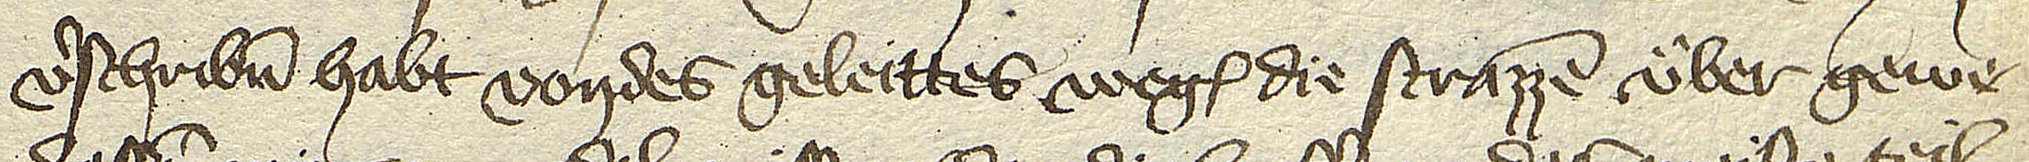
v*ſchribn* habt von des geleittes weg* die ſtraʒʒe* ber gewe /
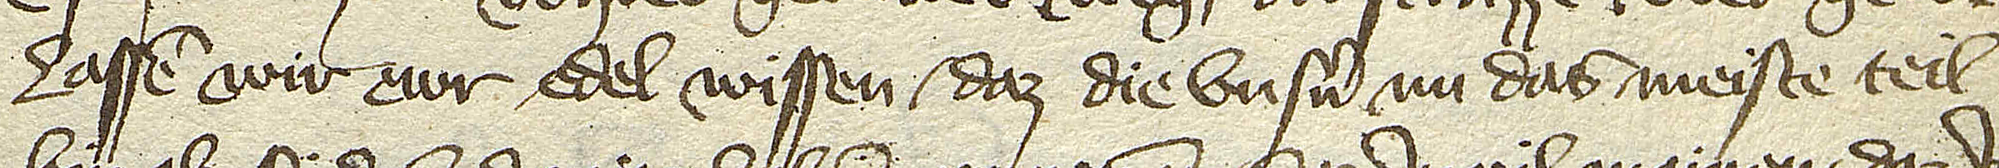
Laſſe* wir ewr edel wiſſen / daʒ die vnſn* nu das meiſte teil
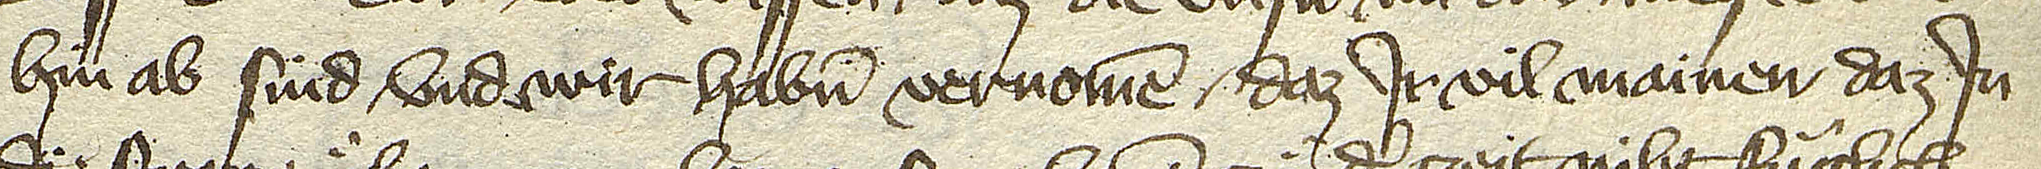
hin ab ſind / vnd wir habn* vernome* / daʒ Ir vil mainen daʒ In
